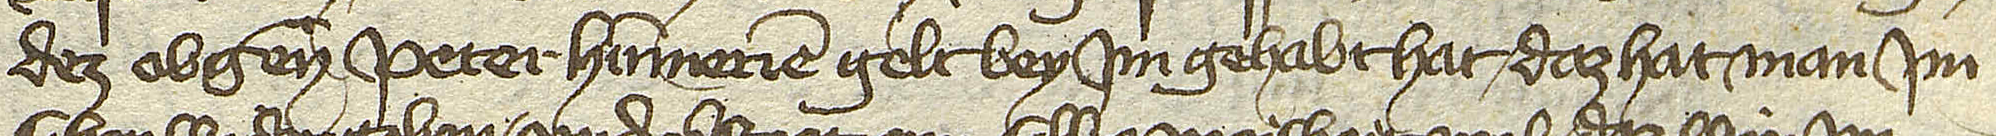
daʒ obg*en Peter hir*mene* gelt bey Im gehabt hat / daʒ hat man Im
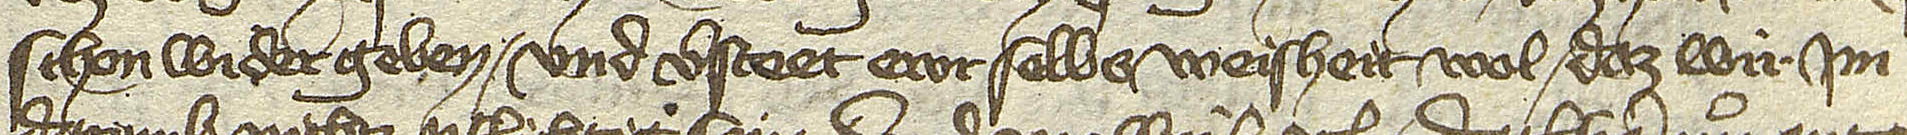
ſchon wider geben / vnd v*ſteet ewr ſelbs weiſheit wol / daʒ wir Im
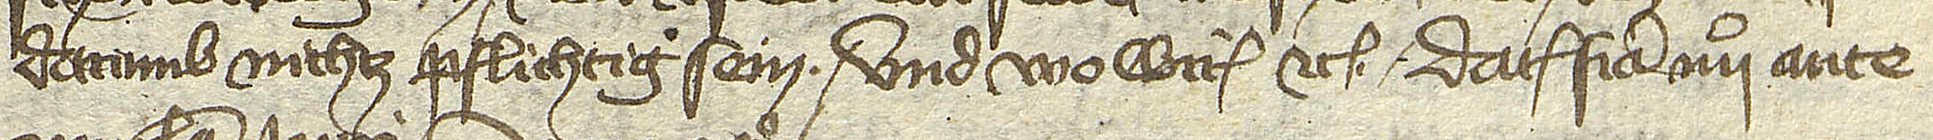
darumb nichtʒ pflichtig ſein . / vnd wo wir ec* . / Dat* fia* iiii* ante
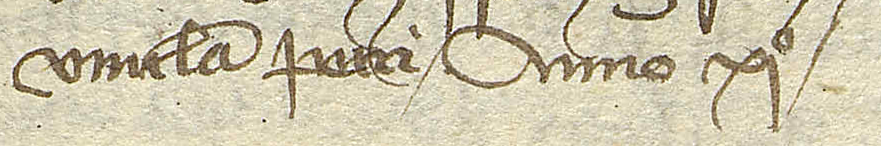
vincla* Petri / . Anno xi* /
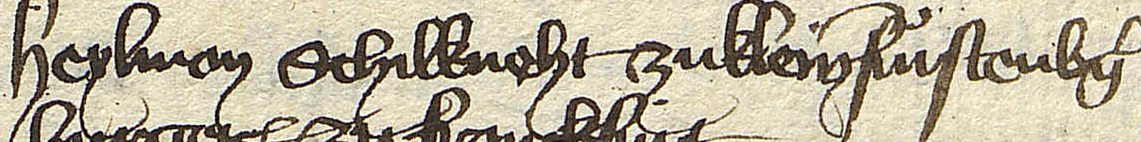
heylman Schilknecht cʒu kleinfürſtenbg*
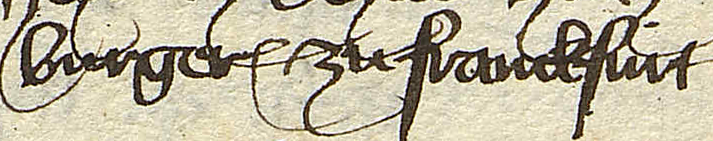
burger* cʒu frankfürt
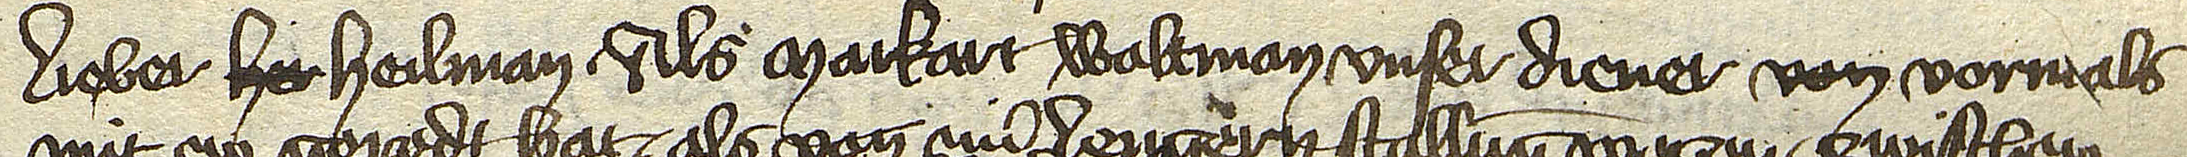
Lieber her heilman / Als Markart waltman vnſer diener von vormals
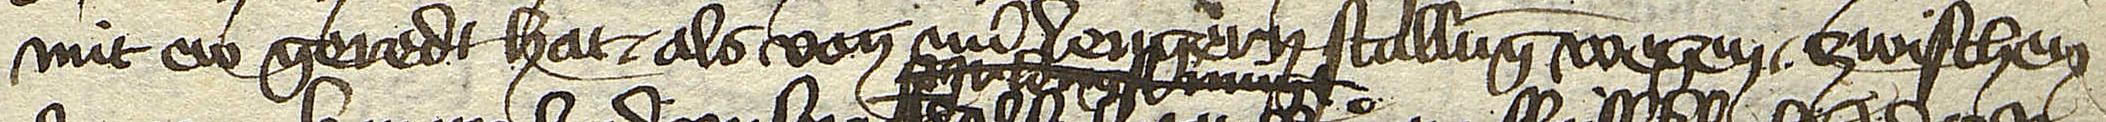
mit ew geredt hat / als von ein* lengern ſtallug* wegen / . cʒwiſchen
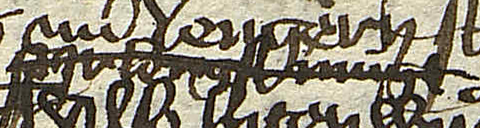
Ir lengſt mügt
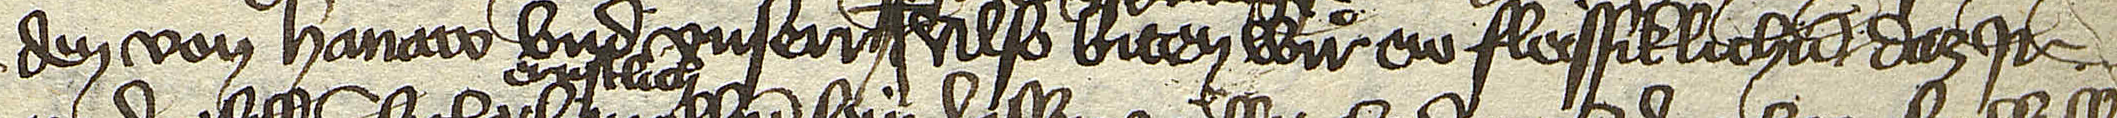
den von hanaw vnd vnſerr Alſo biten wir ew fleiſſiklichn* daʒ Ir
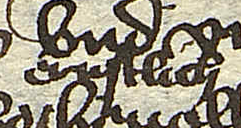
ernſtlich
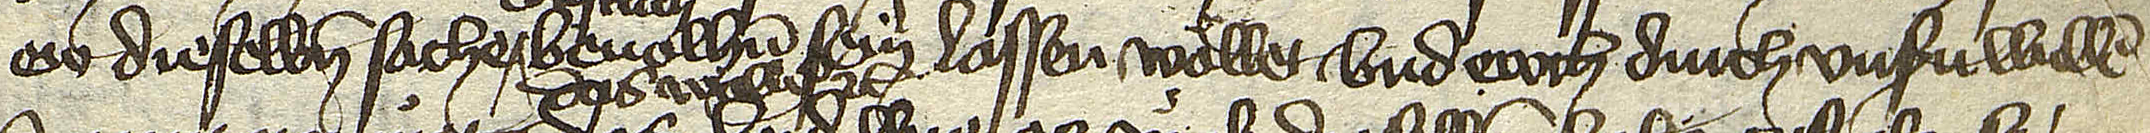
ew dieſelbn* ſache beuolhn* ſein laſſen wöllet / vnd ewch durch vnſ*n wille*
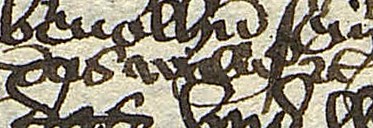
das wölle* ec*
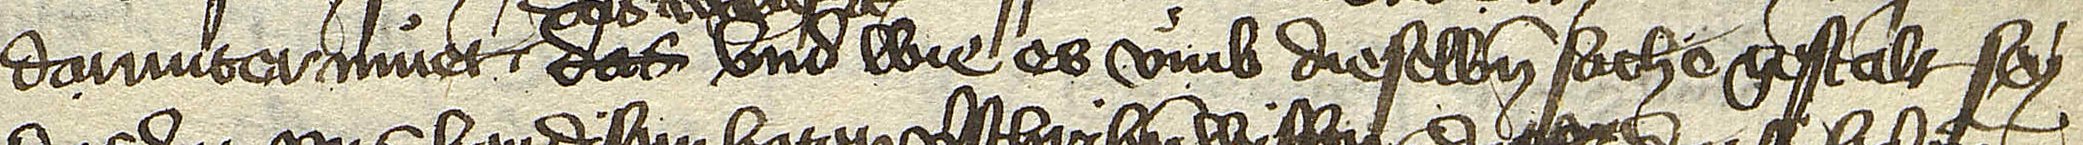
darunter müet / das vnd wie es v̈mb dieſelbn* ſache geſtalt ſey
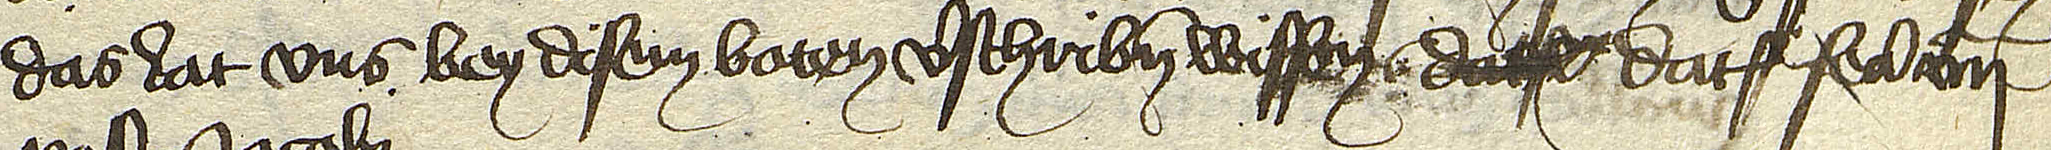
das lat vns bey diſem boten v*ſchribn* wiſſen / datfe dat* fea* vii*
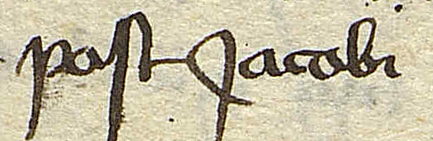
poſt Iacobi
